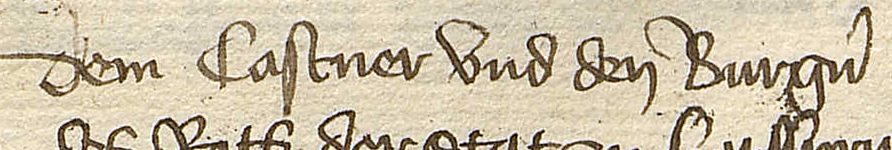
Dem Caſtner vnd den Burgn*
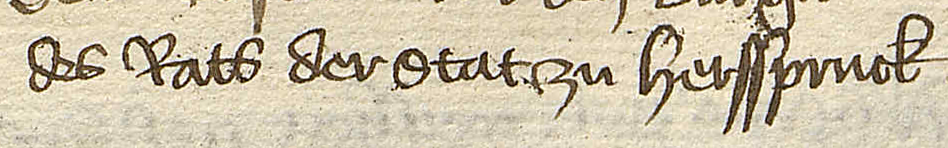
des Rats der Stat cʒu herſſpruck
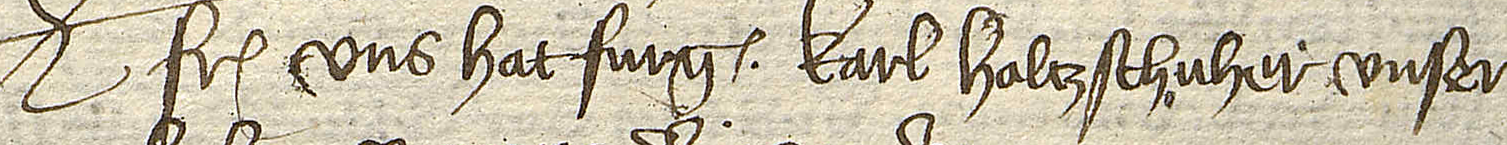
L* fr* vns hat furg* . Karl holcʒſchuher vnſer
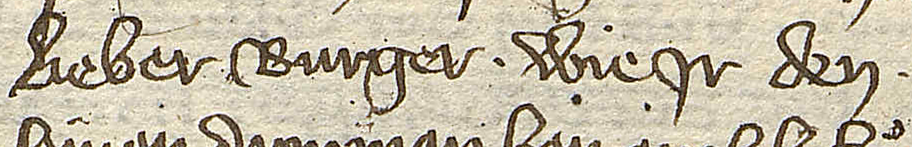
lieber Burger . wie Ir den
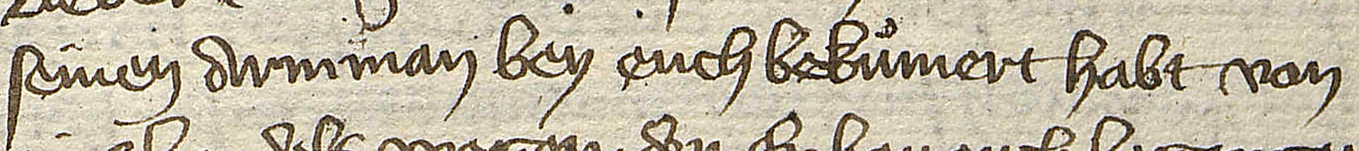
ſeinen Armman bey euch bekümert habt von
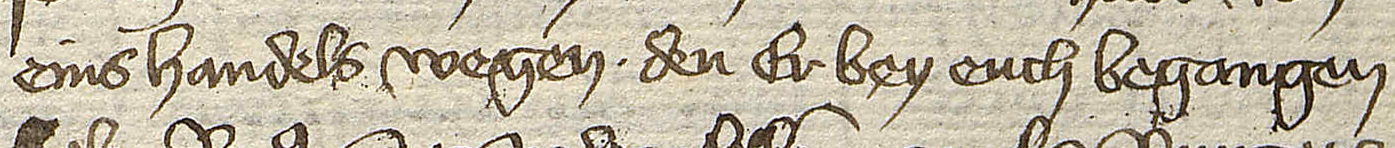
eins handels wegen . den Er bey euch begangen
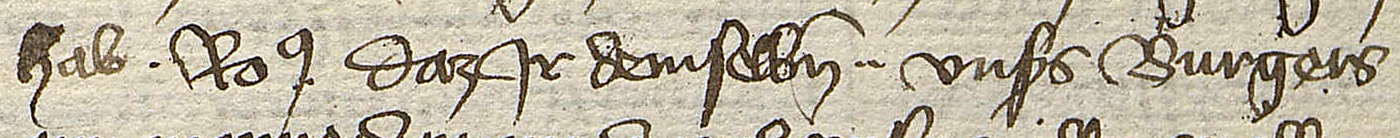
hab . Ro* Daʒ Ir demſelbn* ~ vnſ*s Burgers
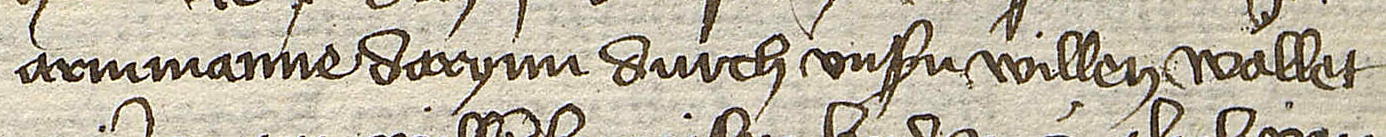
armmanne darynn durch vnſ*n willen wöllet
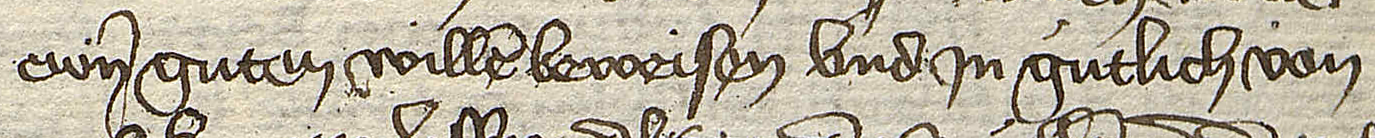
ewn* guten wille* beweiſen vnd In gütlich von
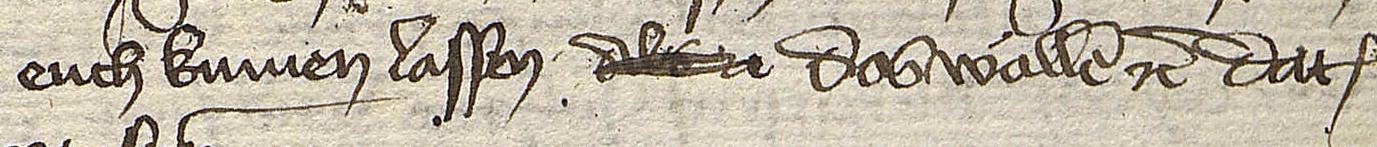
euch kumen laſſen Als ec* Das wölle* ec* Dat*
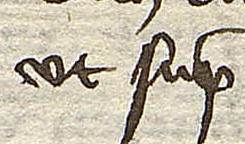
vt ſup*
